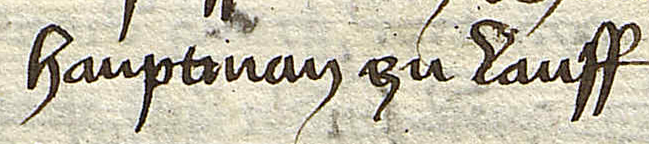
hauptman cʒu lauff
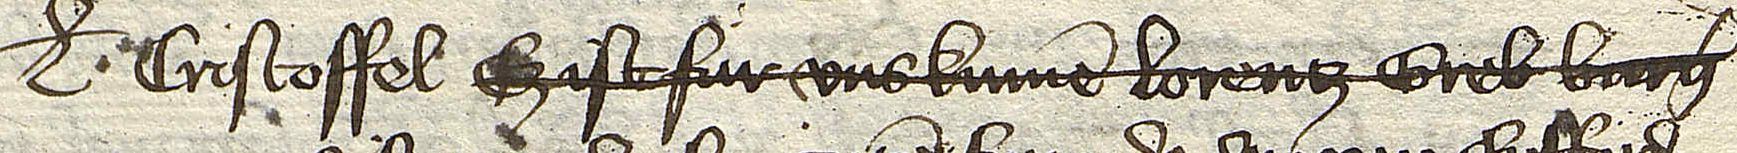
L* Criſtoffel Eʒ iſt für vns kume* lorencʒ Greb burg*
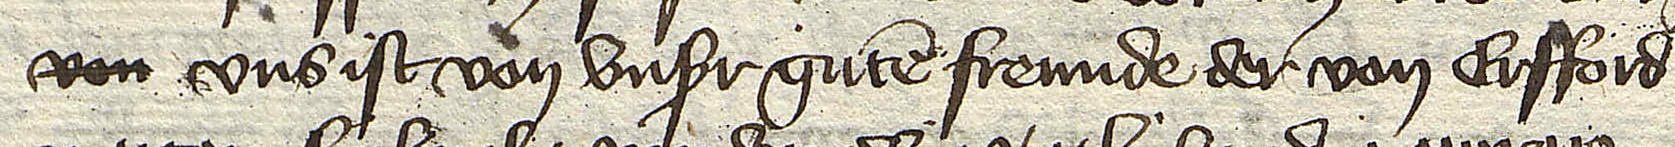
von vns iſt von vnſ*r gute* freunde der von Erfford
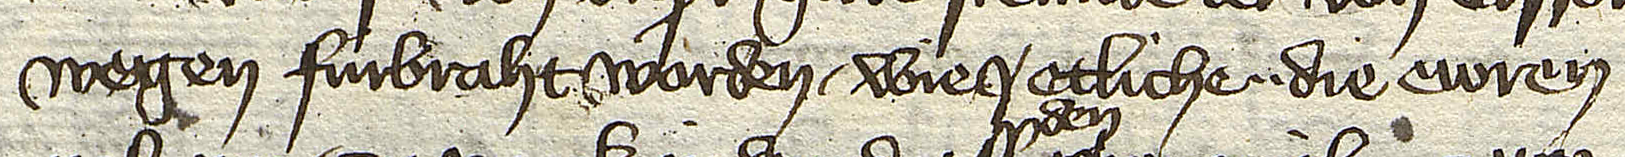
wegen fürbraht worden / wie I etliche ~ die ewren
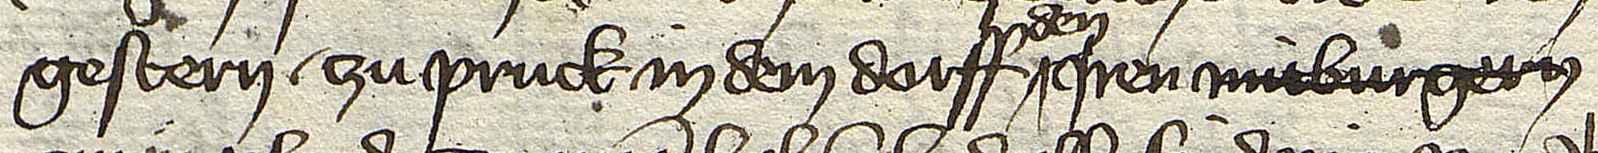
geſtern / cʒu pruck in dem dorff Iren mitburgern
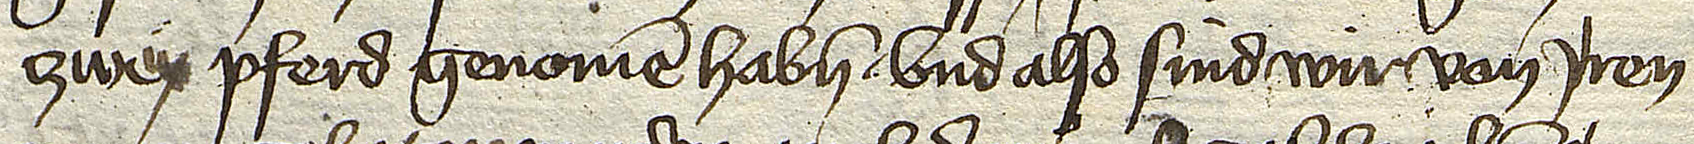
cʒwey pferd genome* habn* / vnd alſo ſind wir von Iren
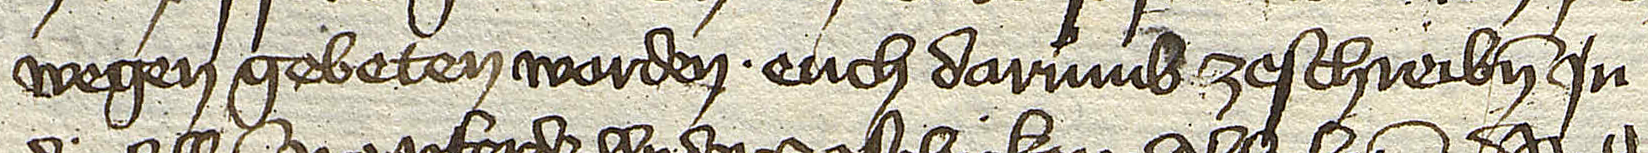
wegen gebeten worden . euch darümb ʒeſchreibn* In
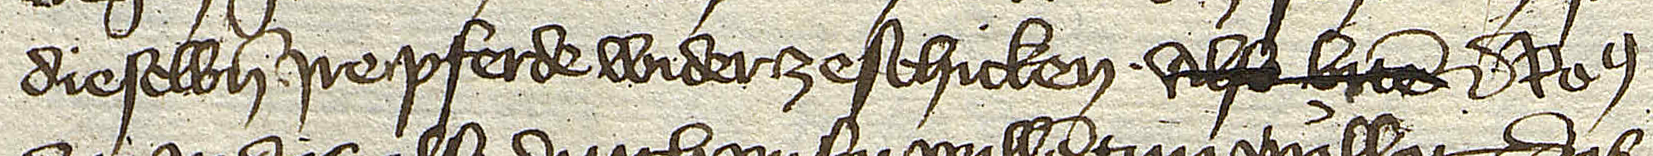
dieſelbn* Ire pferde widercʒeſchicken Alſo bite*ec* Ro*
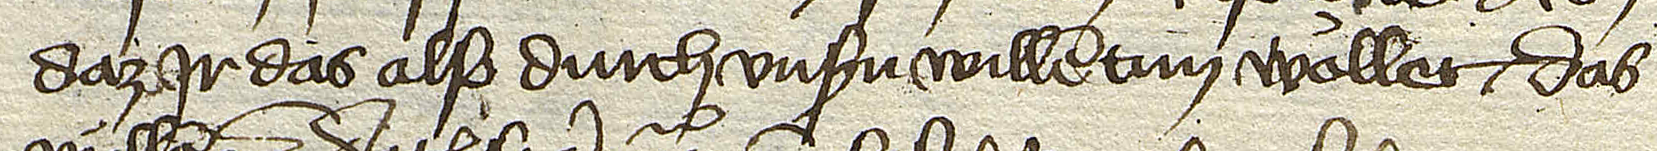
daʒ Ir das alſo durch vnſ*n wille* tun wöllet / das
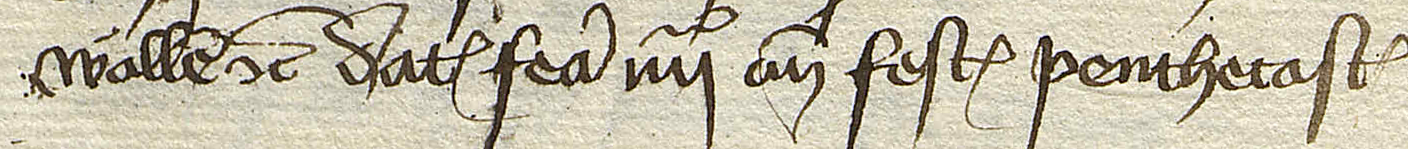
wölle* ec* Dat* fea* iiii* an* feſt* penthecoſt*
